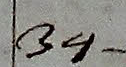34
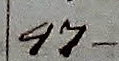47
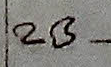23
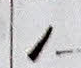1
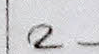2
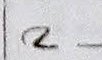2
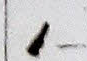1
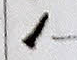1
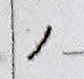1
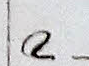2
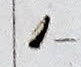1
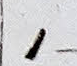1
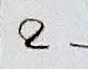2
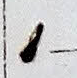1
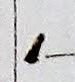1
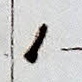1
